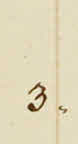3
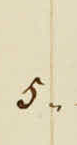5
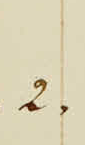2
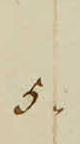5
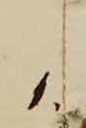1
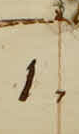1
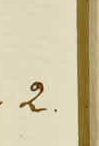2.
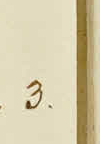3.
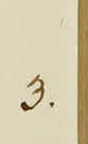3.
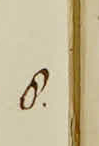8.
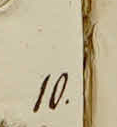10.
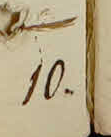10.
